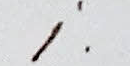1.
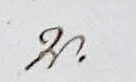2.
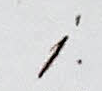1
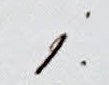1
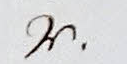2.
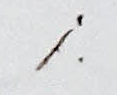1.
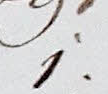1
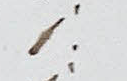1.
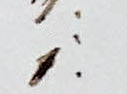1.
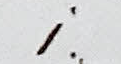1.
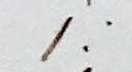1.
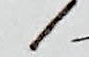1
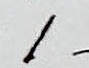1
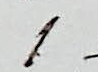1
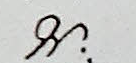2.
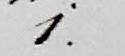1.
